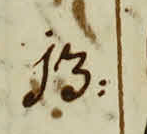13:
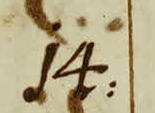14:
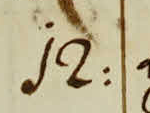12:
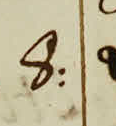8:
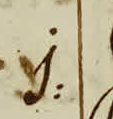1:
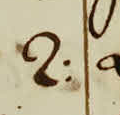2:
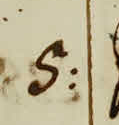5:
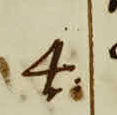4:
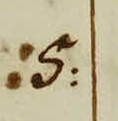5:
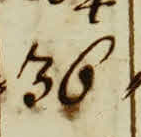36
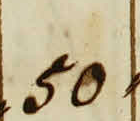50
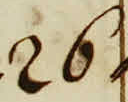26
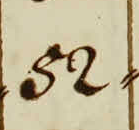52
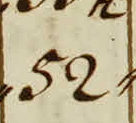52
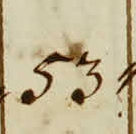53
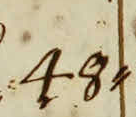48
